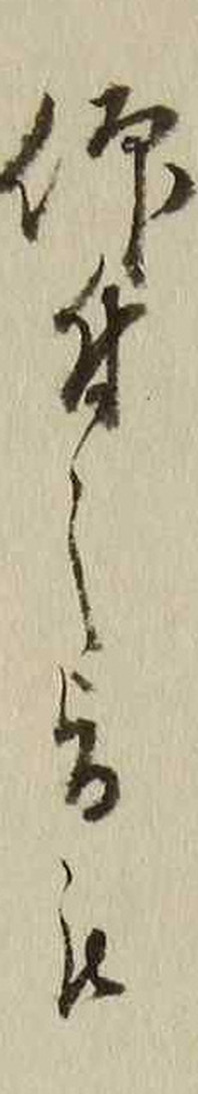仰付之旨被仰付候事
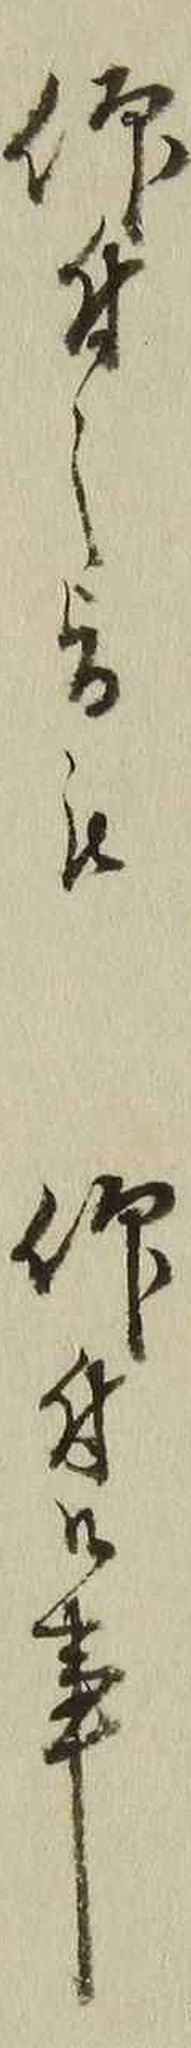仰付之旨被仰付候事
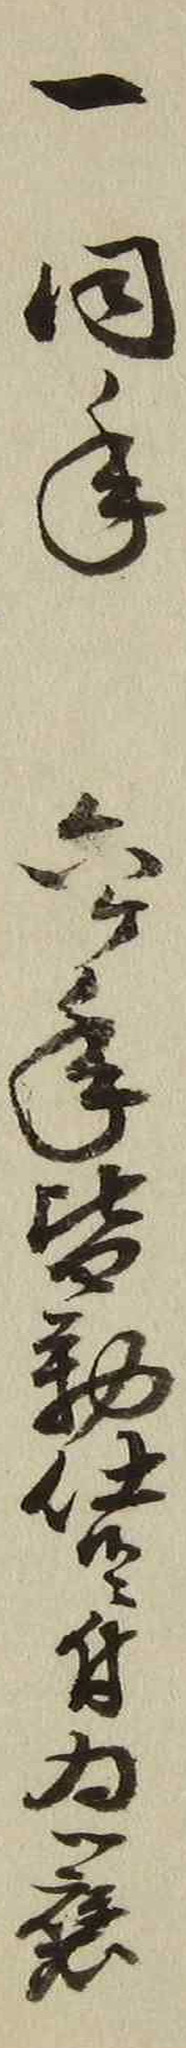一同年六ケ年皆勤仕候ニ付為御褒
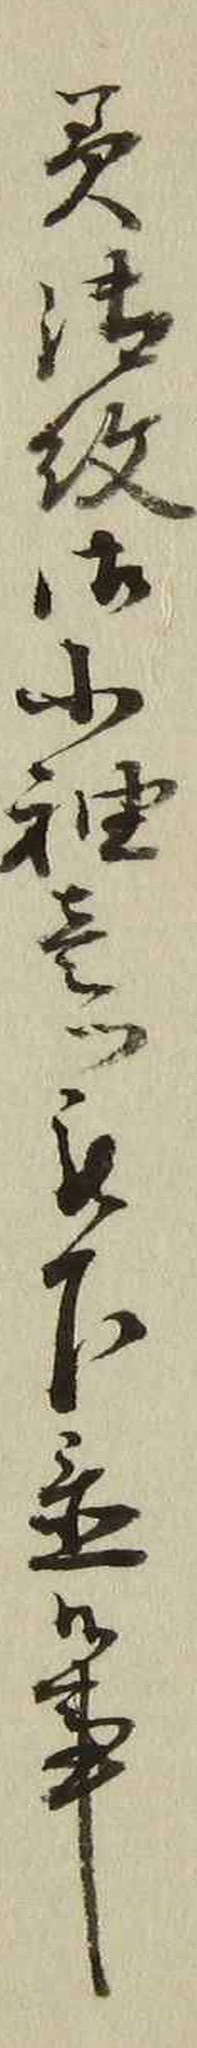美御紋御小袖壱ツ被下置候事
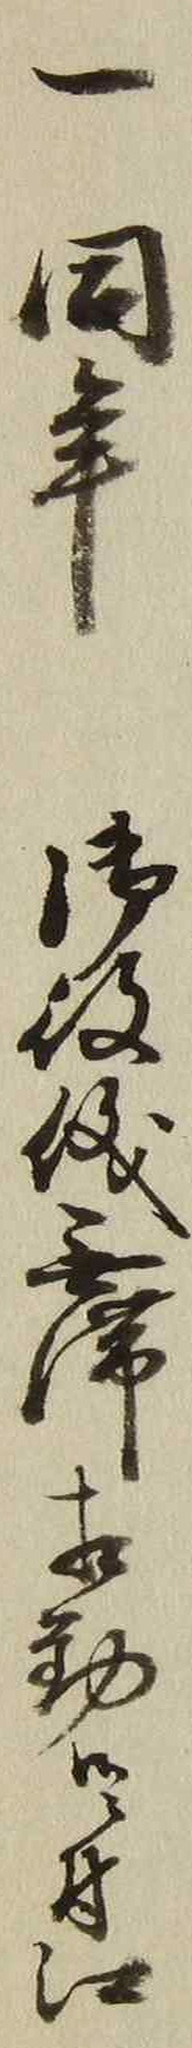一同年御役儀無滞相勤候ニ付江
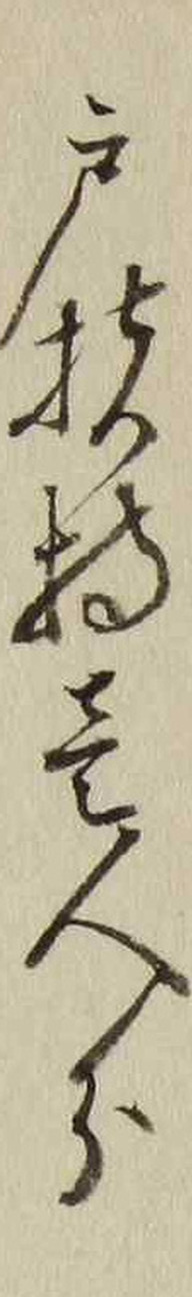戸扶持壱人分
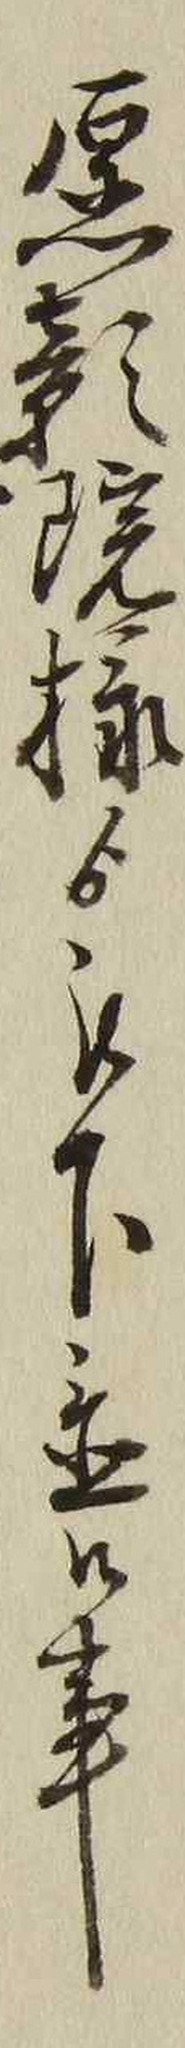愿彰院様ゟ被下置候事
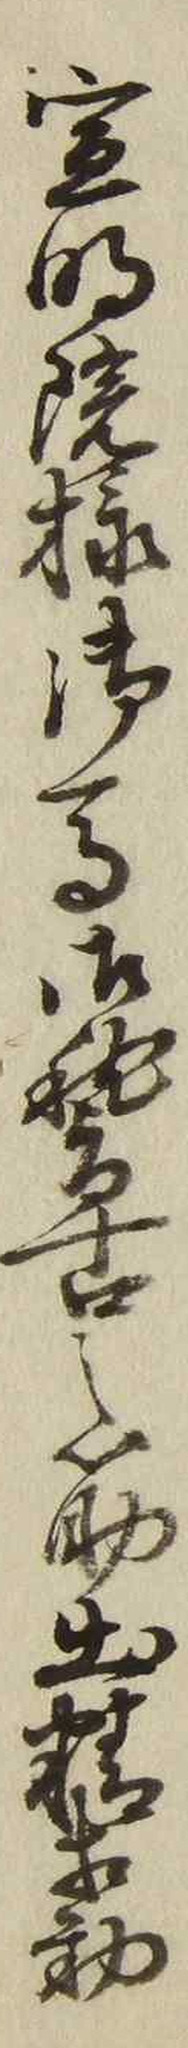宣明院様御馬術御稽古之筋出精相勤

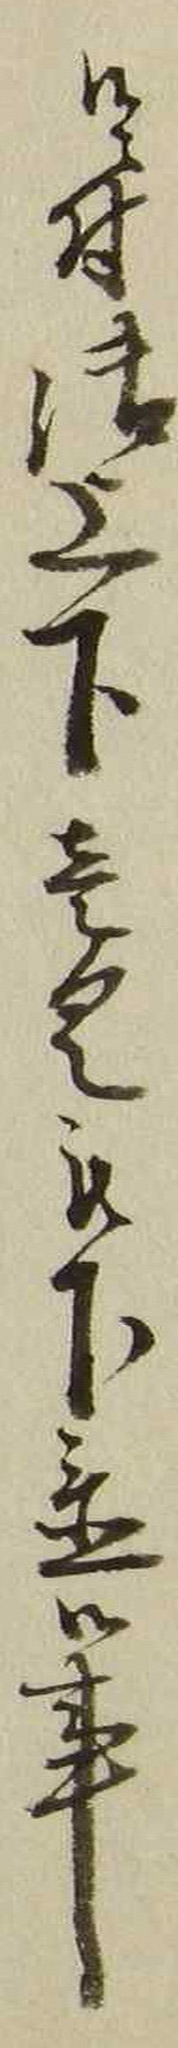候ニ付御上下壱具被下置候事
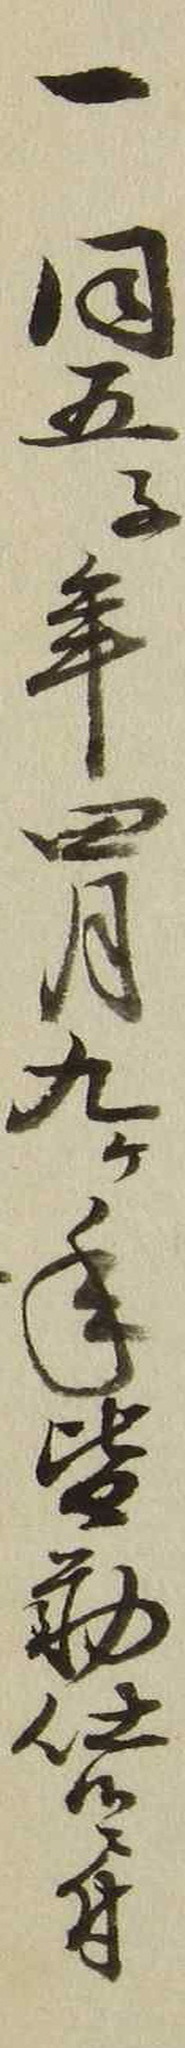一同五子年四月九ケ年皆勤仕候ニ付
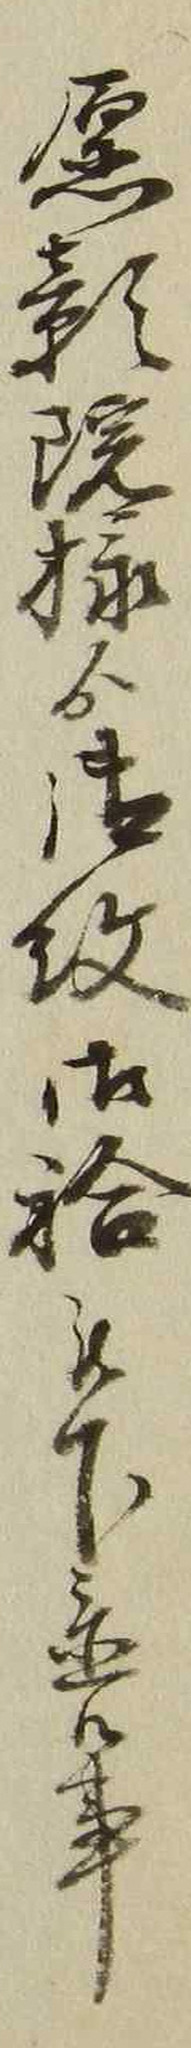愿彰院様ゟ御紋御袷被下置候事
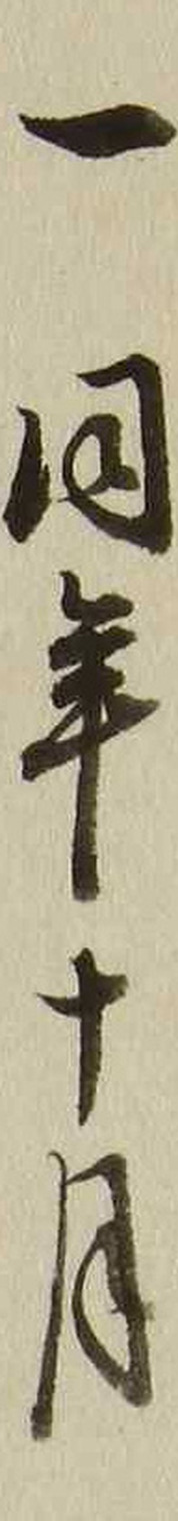一同年十月
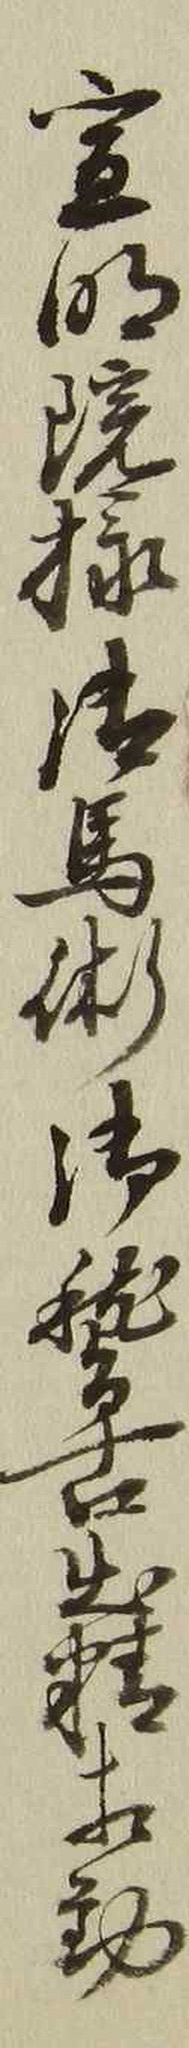宣明院様御馬術御稽古出精相勤
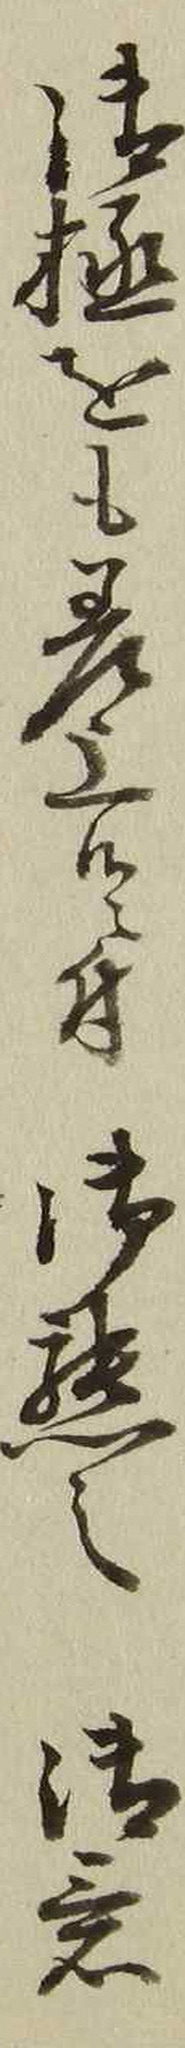御極をも差上候ニ付御懇之御意
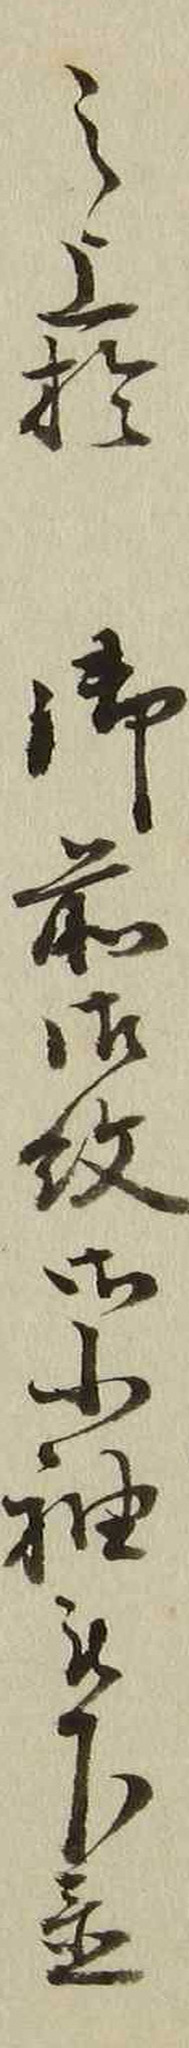之上於御前御紋御小袖被下置
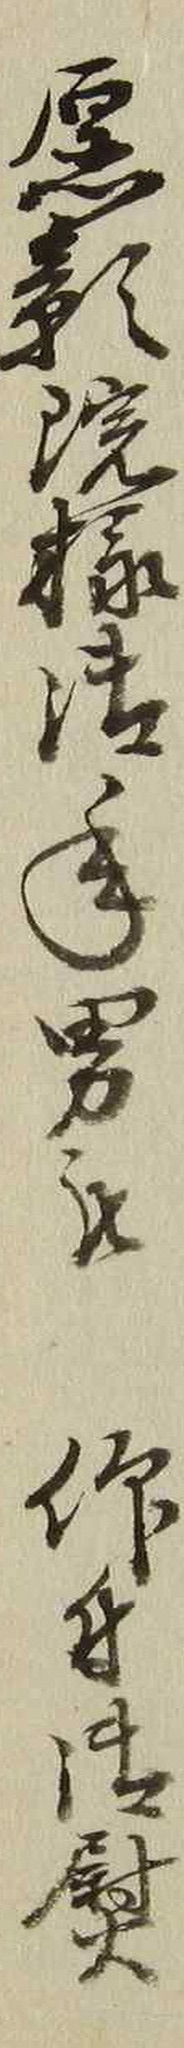愿彰院様御年男被仰付御熨
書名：諸士系譜　巻之31　い之部31
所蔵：会津若松市立会津図書館
